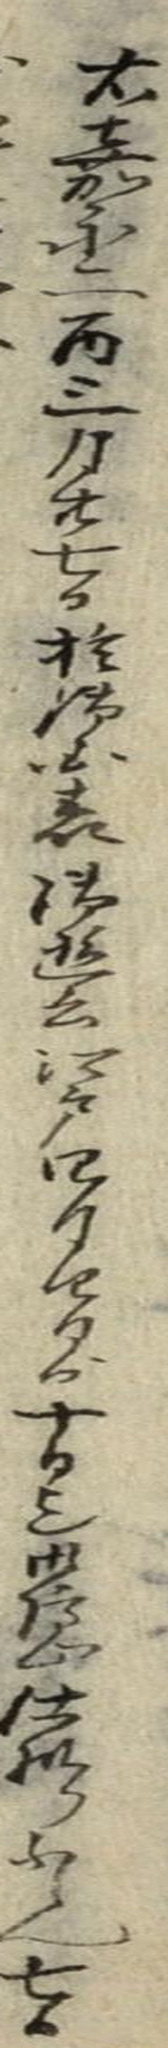右嘉永二酉三月廿七日於御国表御逝去江戸四月四日ゟ十日迄御停止仕掛りふしん七日
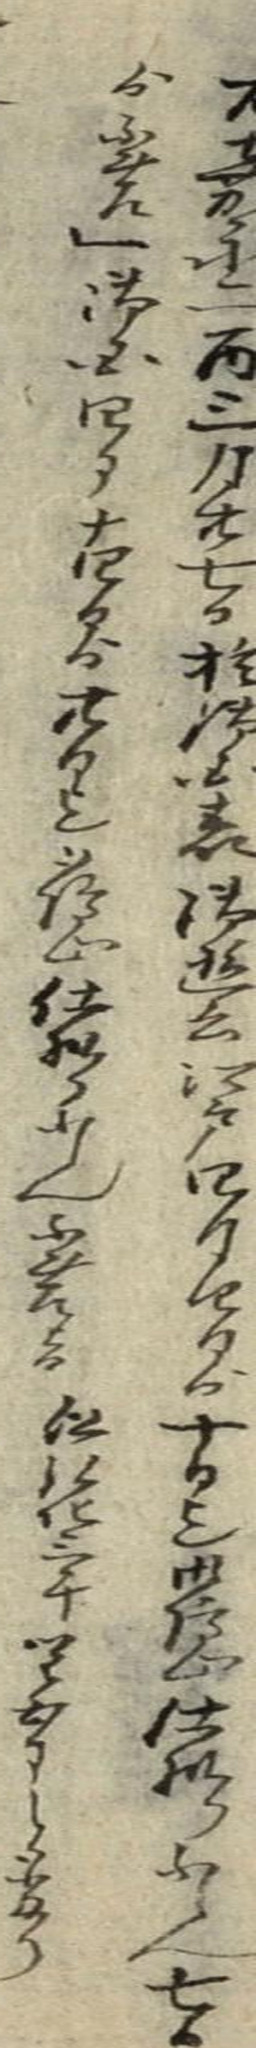ゟ不苦」御国四月十四日ゟ廿日迄御停止仕掛りふしん不苦旨但弘化三午閏五月之御当り
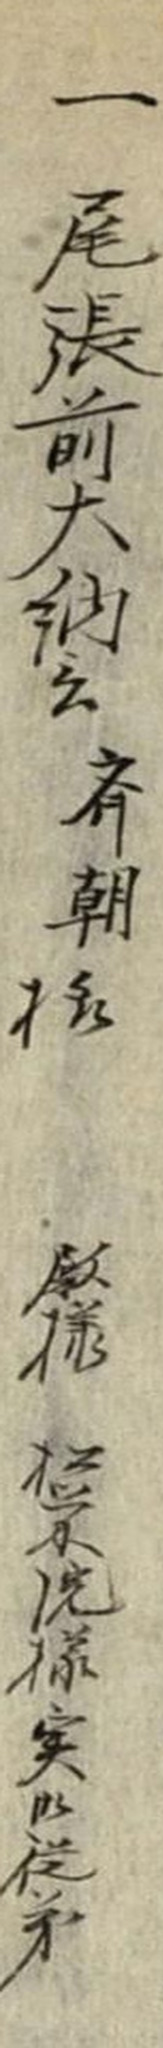一尾張前大納言斉朝様殿様松栄院様実御従弟
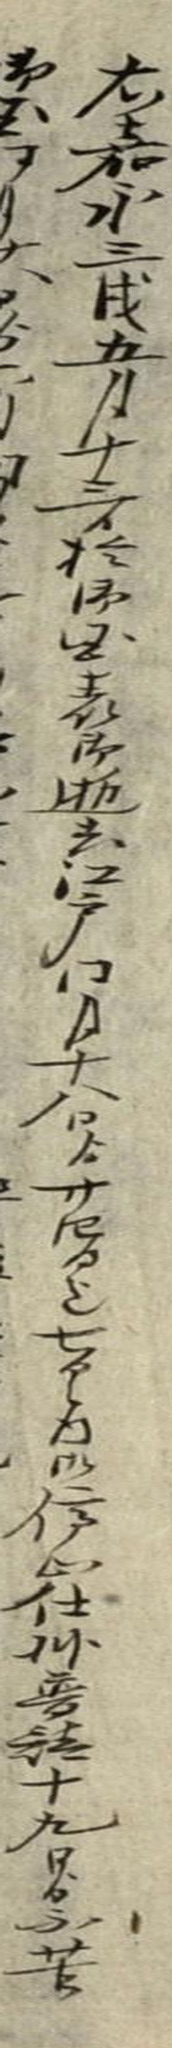右嘉永三戌五月十三日於御国表御逝去江戸同月十八日ゟ廿四日迄七日之内御停止仕掛普請十九日ゟ不苦
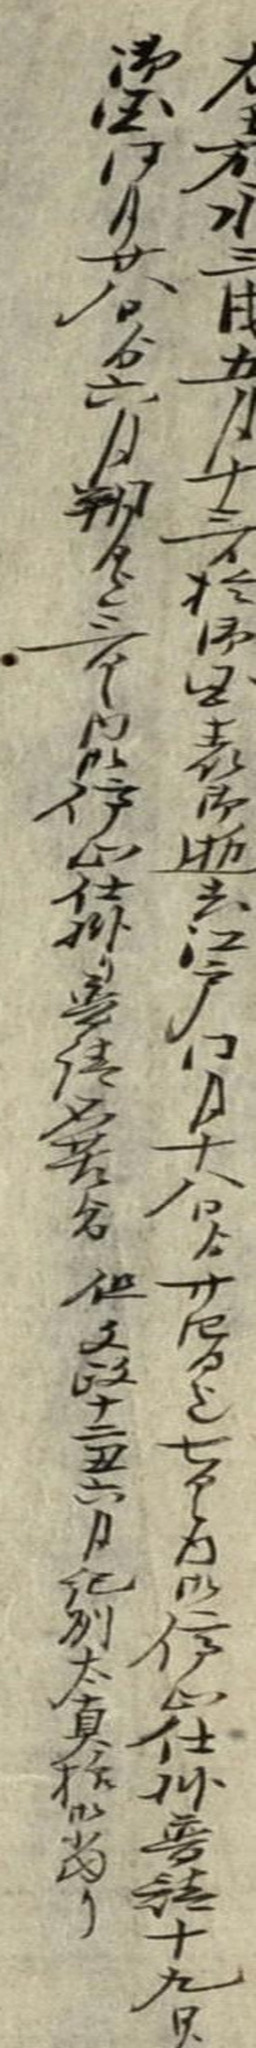御国同月廿八日ゟ六月朔日迄三日之内御停止仕掛り普請不苦旨但文政十二丑六月紀州太真様御当り

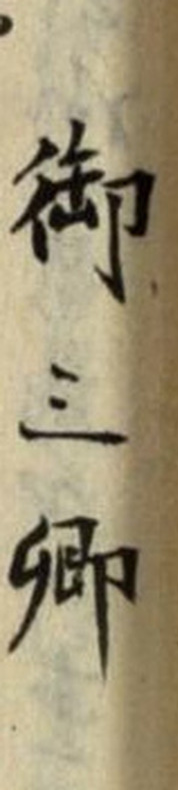御三卿
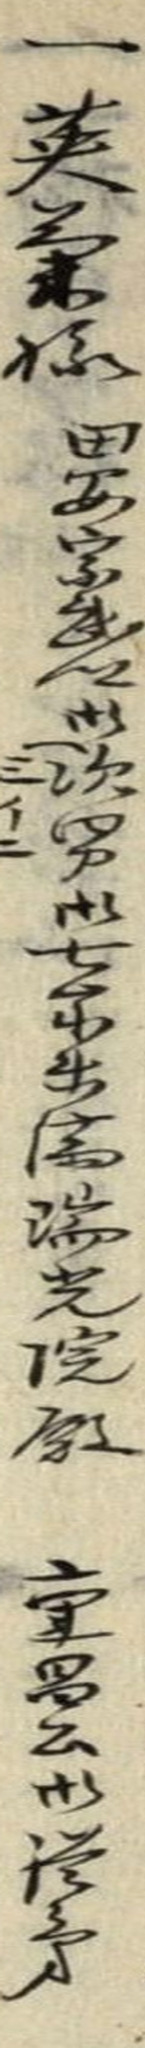一英菊様田安宗武卿御次男御七歳未満瑞光院殿重昌公御従弟
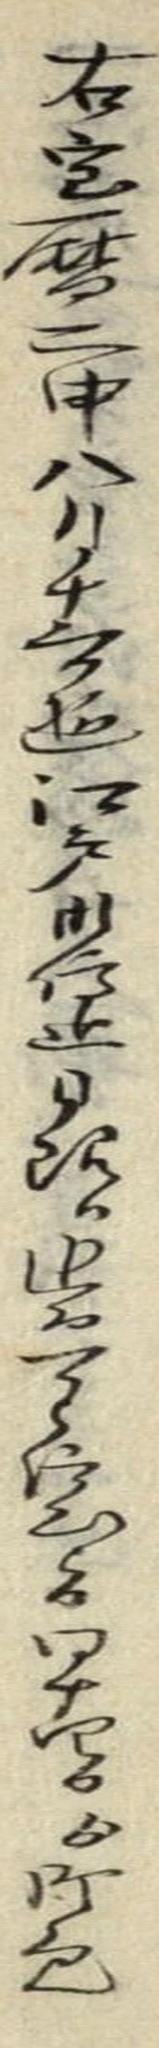右宝暦二申八月十二日逝江戸御停止日限は追て可被仰出旨同十四日ゟ御免
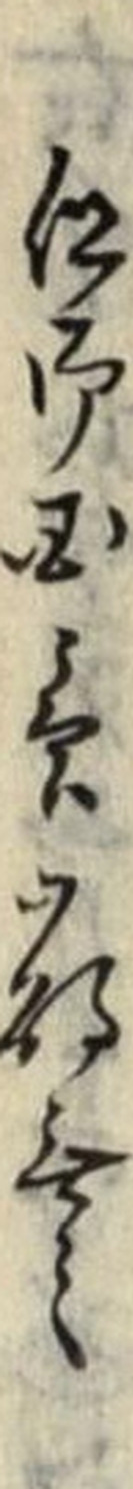但御国にては御触無之
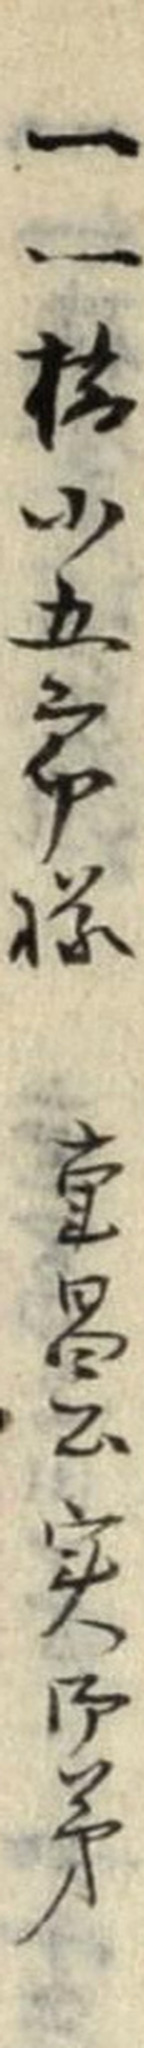一一橋小五郎様重昌公実御弟
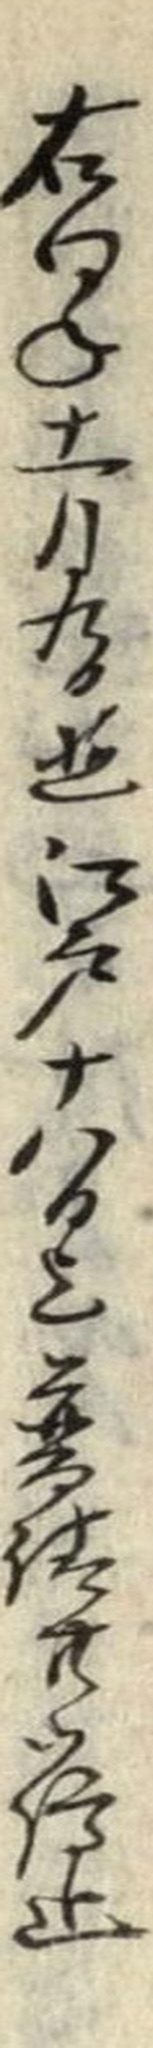右同年十一月九日逝江戸十八日迄普請共御停止
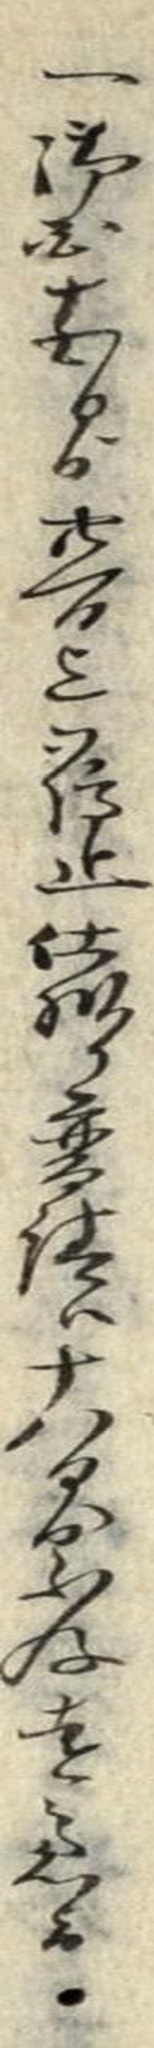一御国十五日ゟ廿一日迄御停止仕掛り普請は十八日ゟ不及遠慮旨
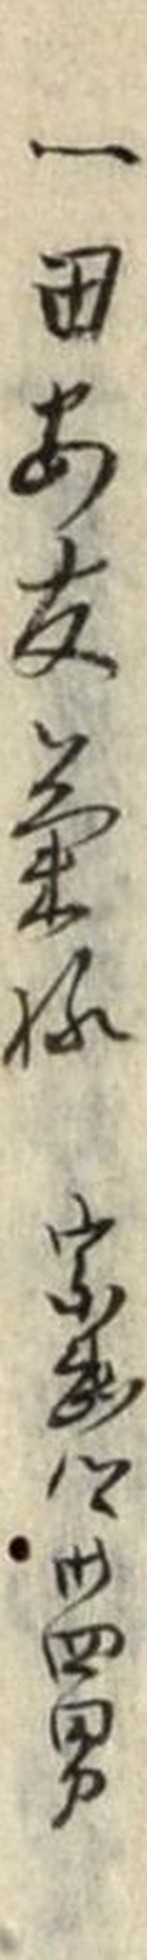一田安友菊様宗武卿御四男
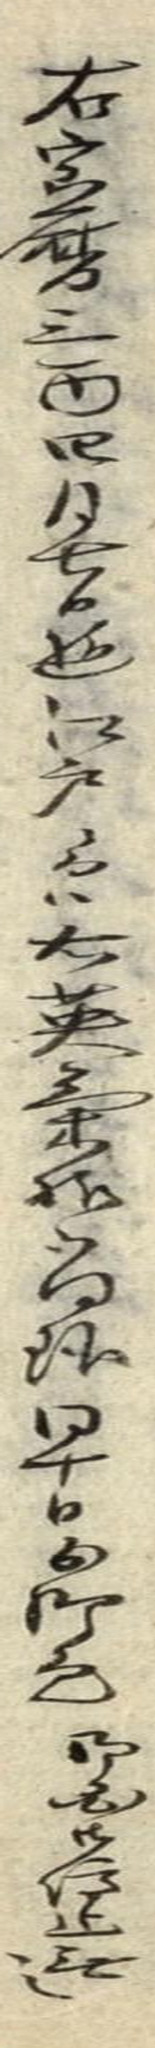右宝暦三酉四月七日逝江戸にては右英菊様御同趣同十日ゟ御免御国御停止無之
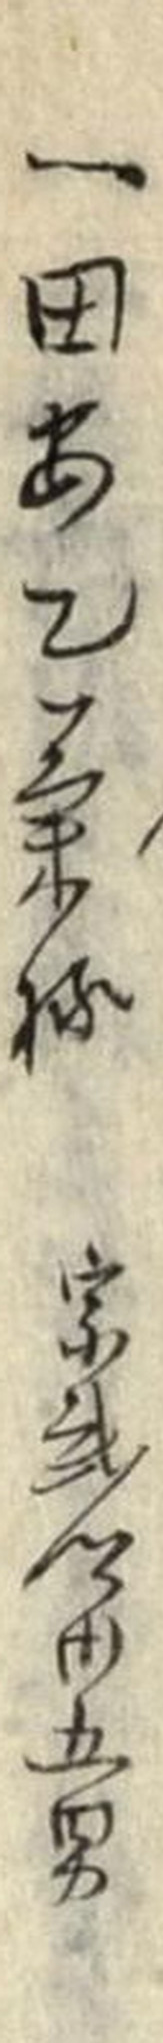一田安乙菊様宗武卿御五男
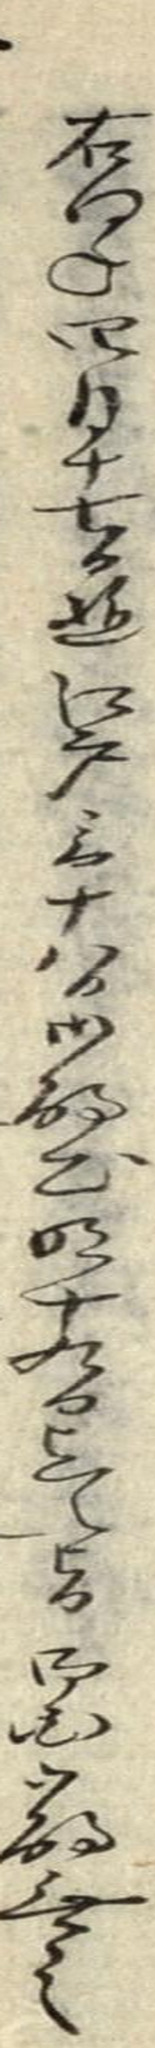右同年四月十七日逝江戸にて十八日御触出明十九日迄之旨御国御触無之
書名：御停止異変死失
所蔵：福井県文書館 Fukui Prefectural Archives
